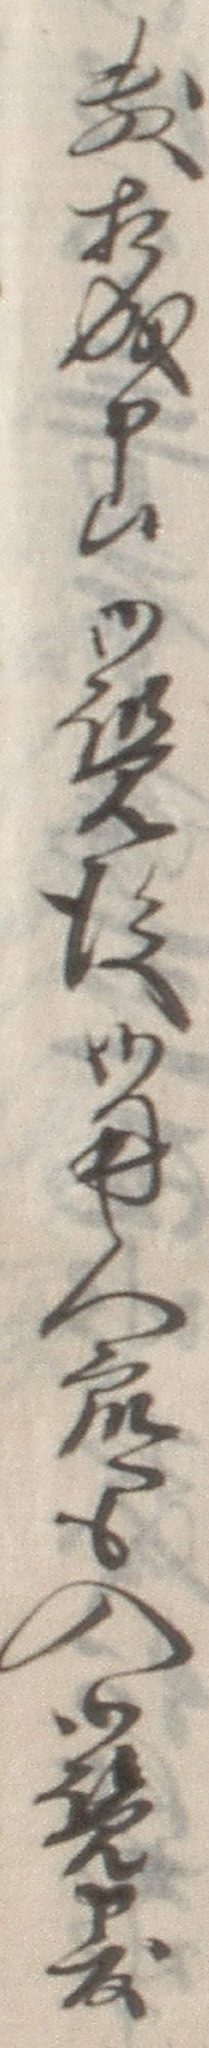敷相成申候御覧後御用人衆ㇸも入御覧申度
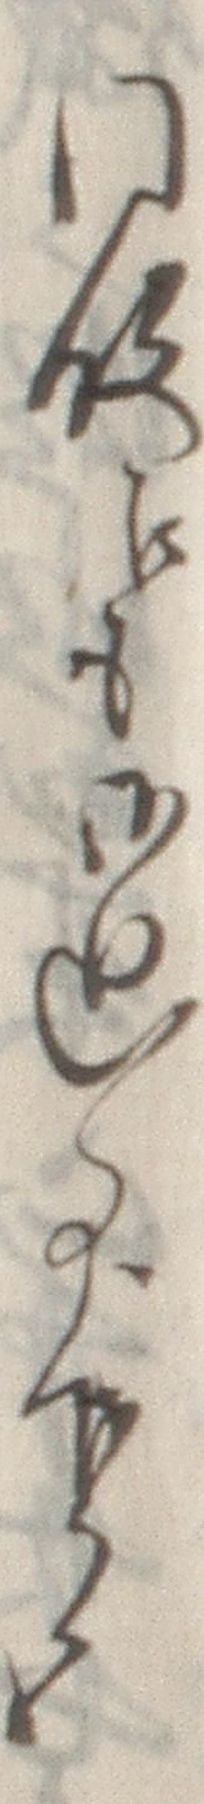同役江も御廻可下候以上
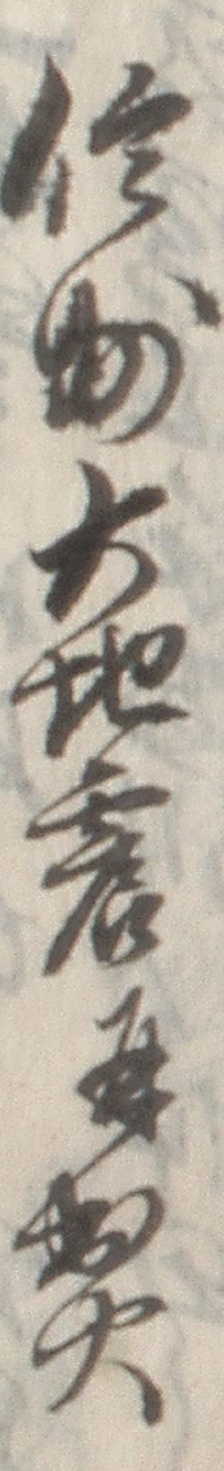信州大地震并出火
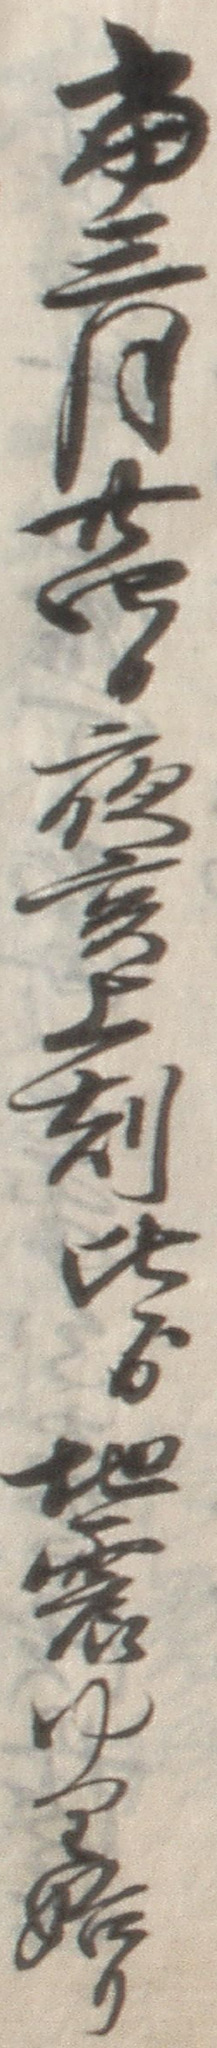当三月廿四日夜亥上刻比ゟ地震ゆり始り
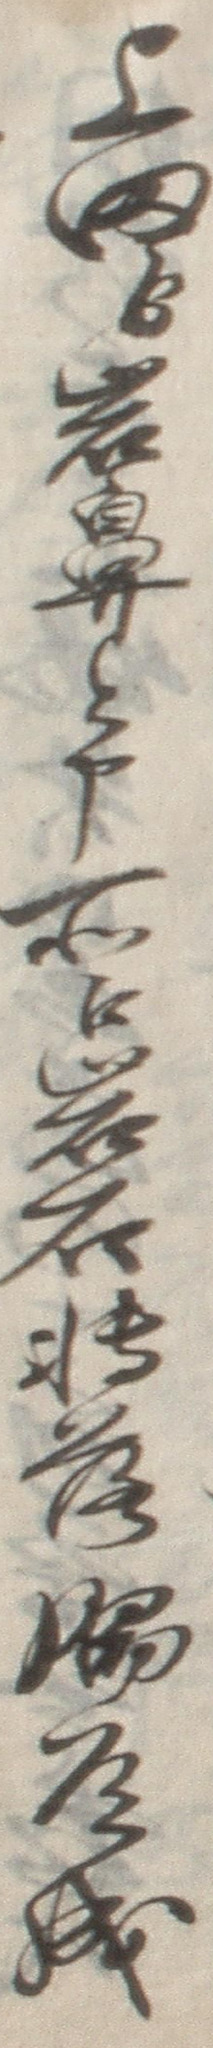上田ゟ岩鼻と申所江岩石転落脇道残
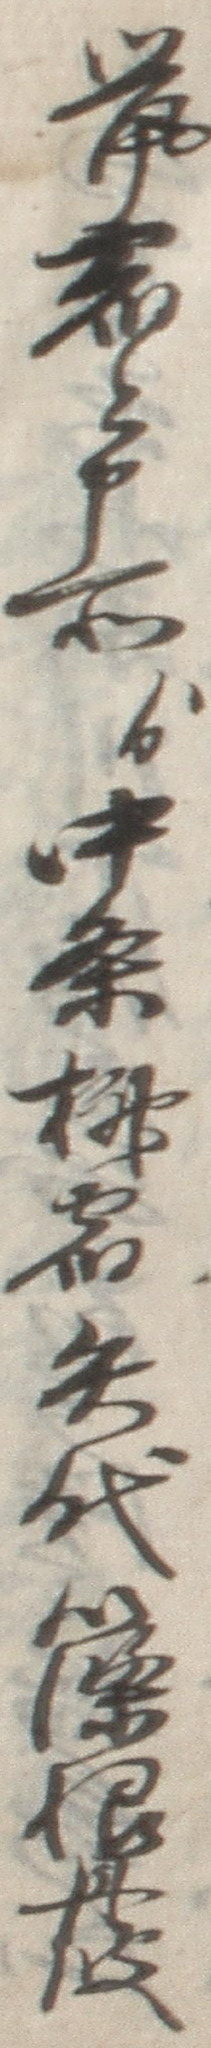鼠宿と申所ゟ中条榊宿矢代篠根丹波

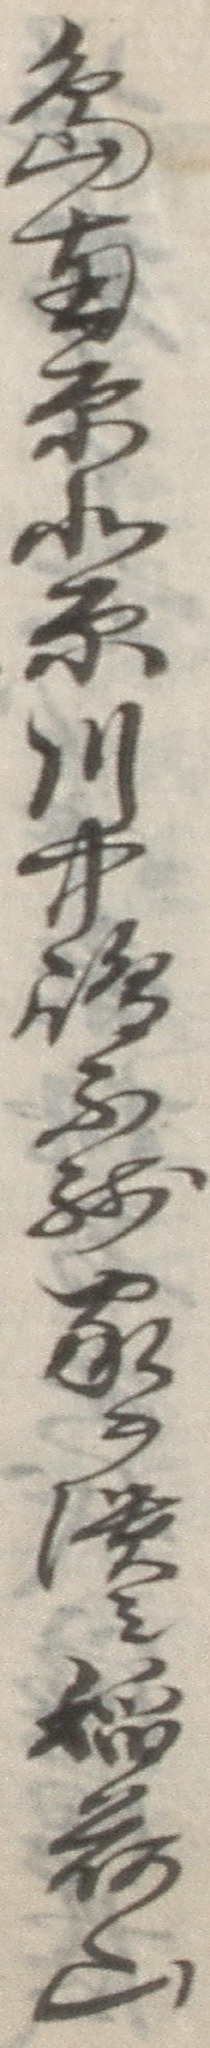島南原北原川中嶋不残家ヲ潰ㇱ稲荷山
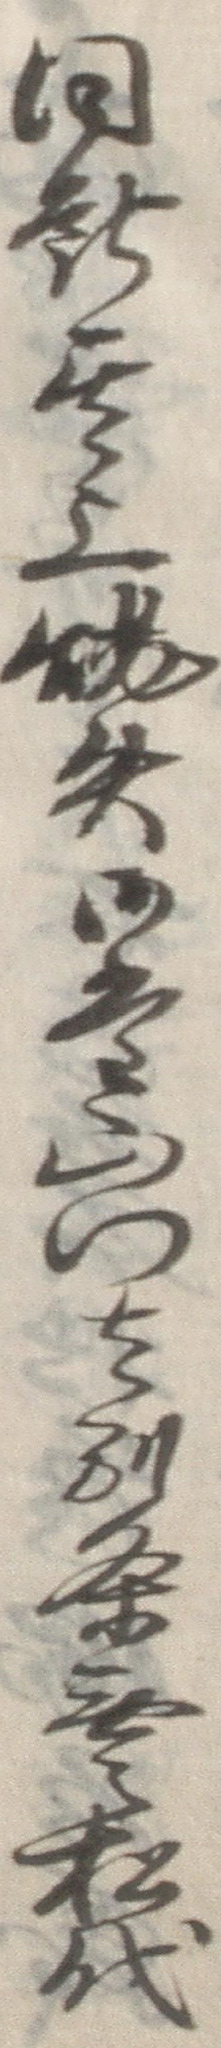同断其上焼失御堂山門は別条無之松代
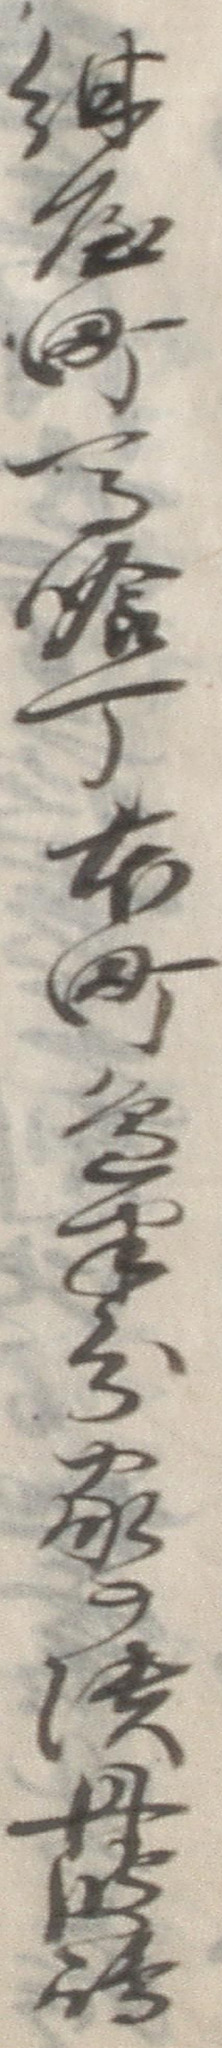紺屋町馬喰丁本町辺半分家ヲ潰丹波嶋
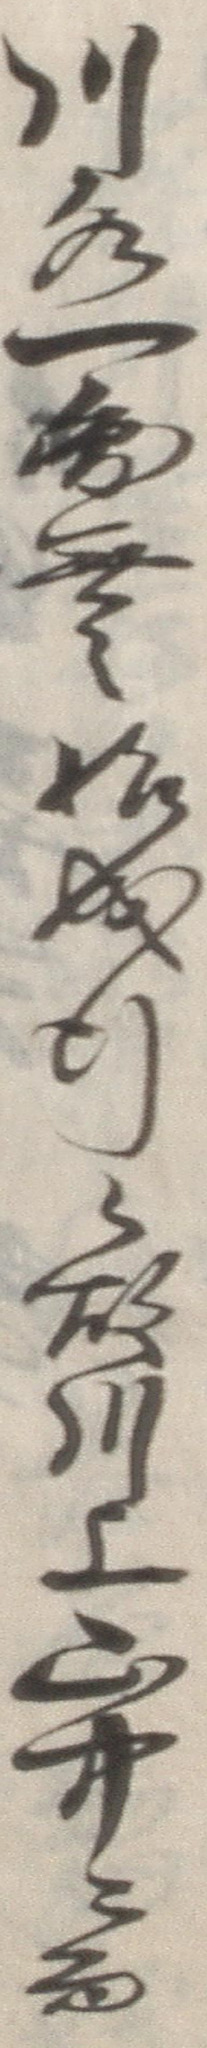川水一円無之様成行候故川上山中二而
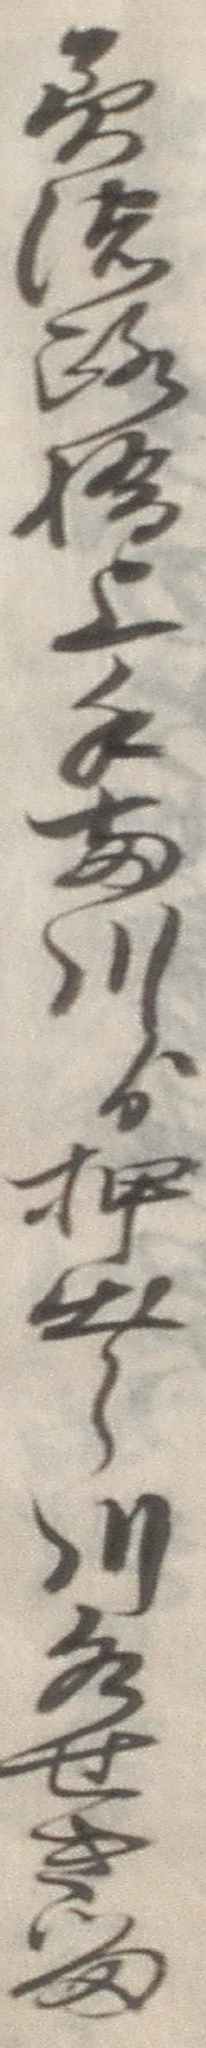美濃路橋上手両川ゟ押出し川水せき留
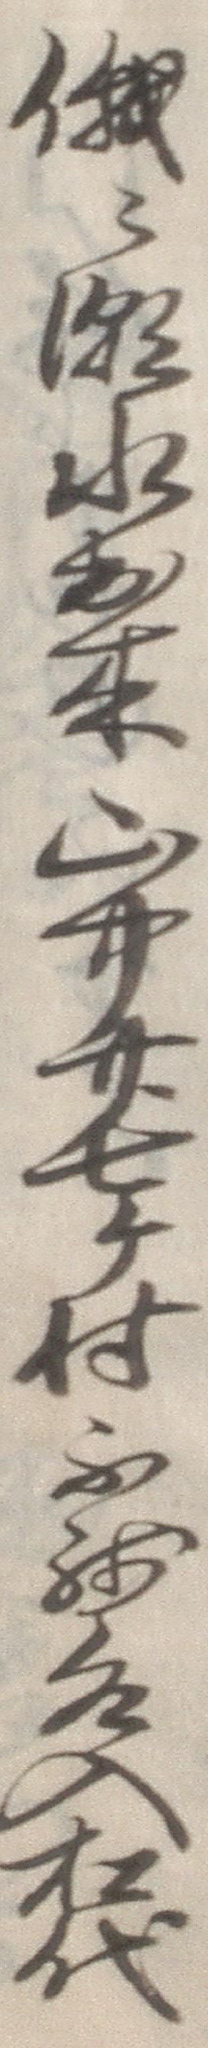俄二湖水出来山中廿七ヶ村不残水入松代
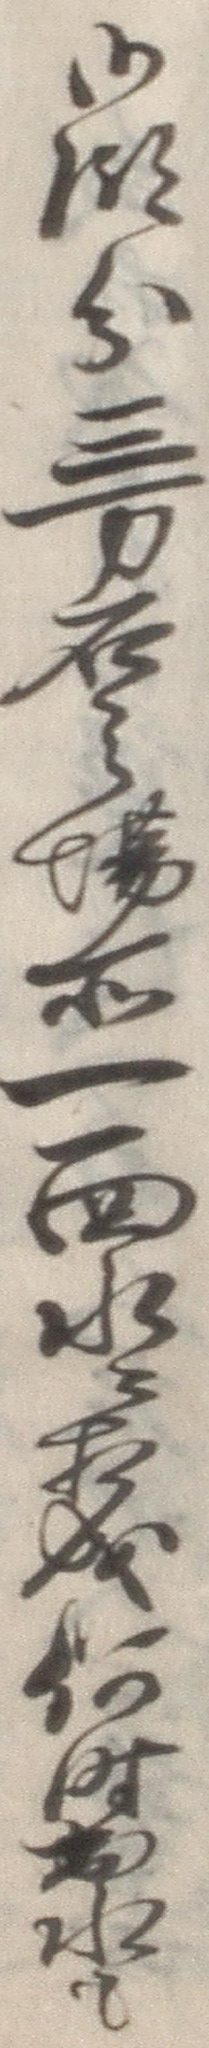御領分三万石之場所一面水二相成何時出水も
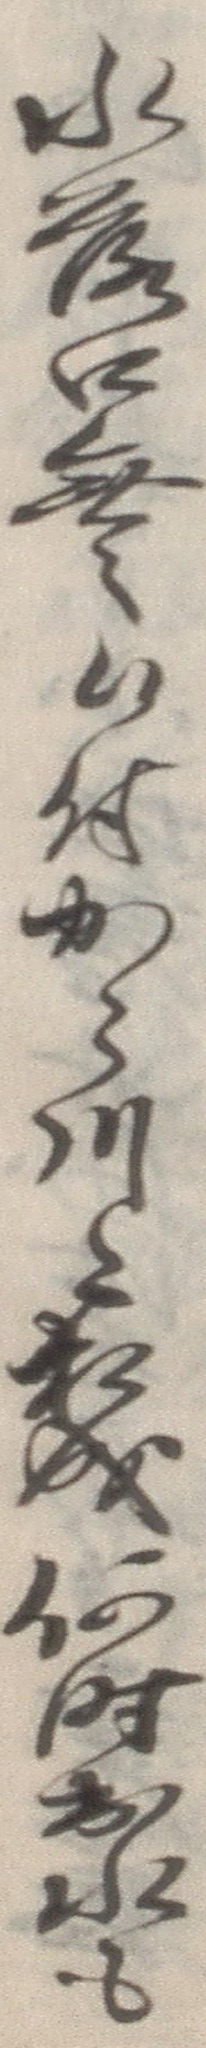水落口無之候付から川二相成何時出水も
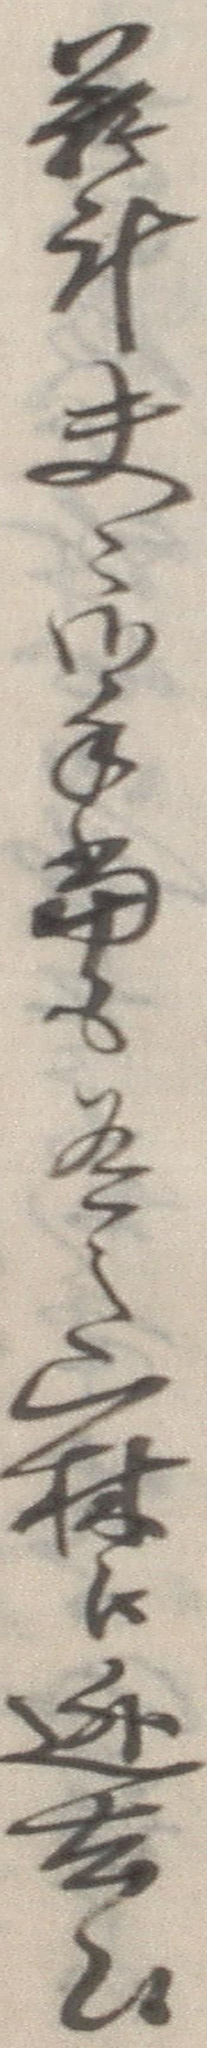難計夫々御手当も有之山林江逃去候
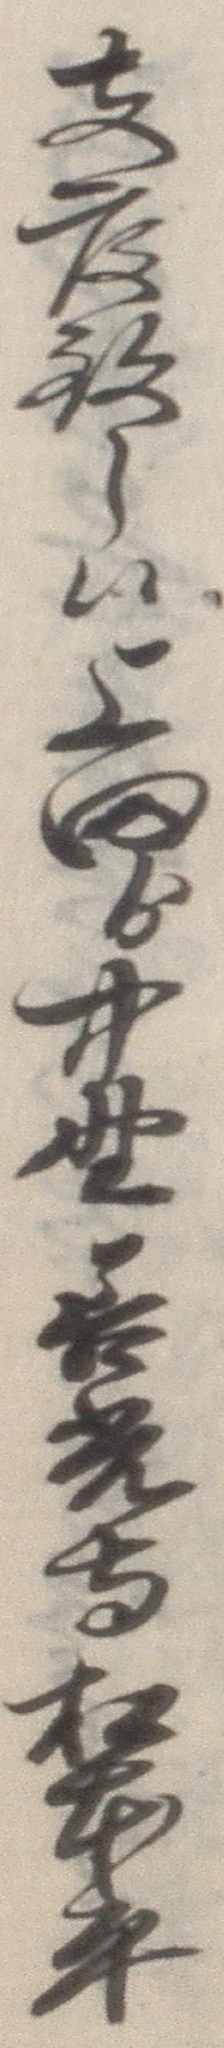支度致し候上田ゟ中野善光寺松本平
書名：信州地震一件
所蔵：東京大学地震研究所図書室 Earthquake Research Institute Library, The University of Tokyo, JAPAN
